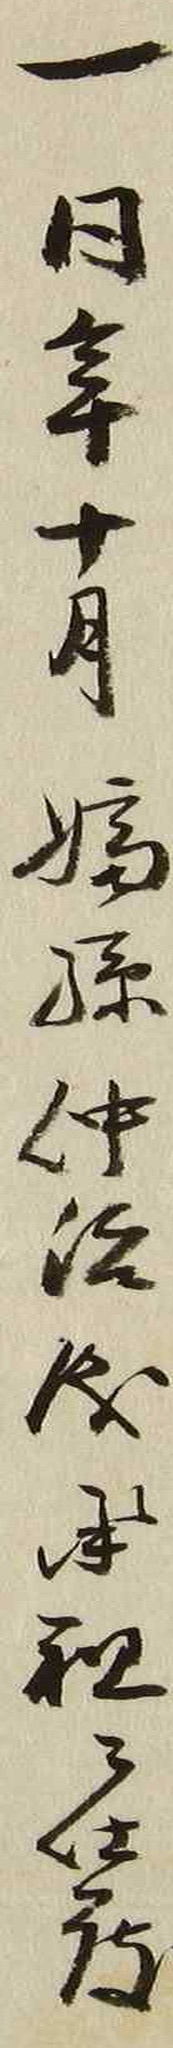一同年十月嫡孫仲治儀承祖ニ仕度
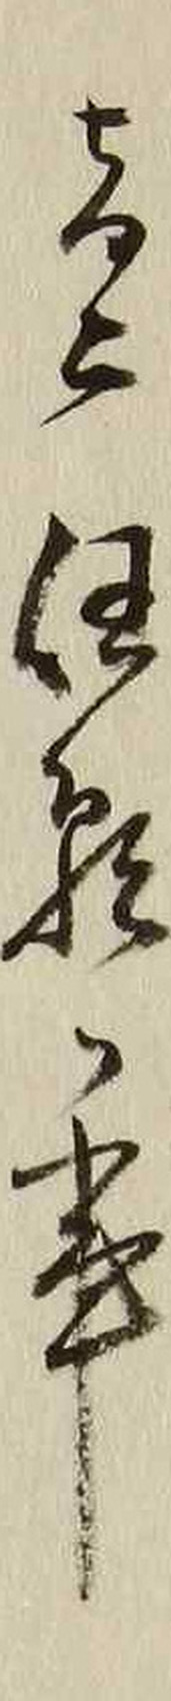旨被任願候事
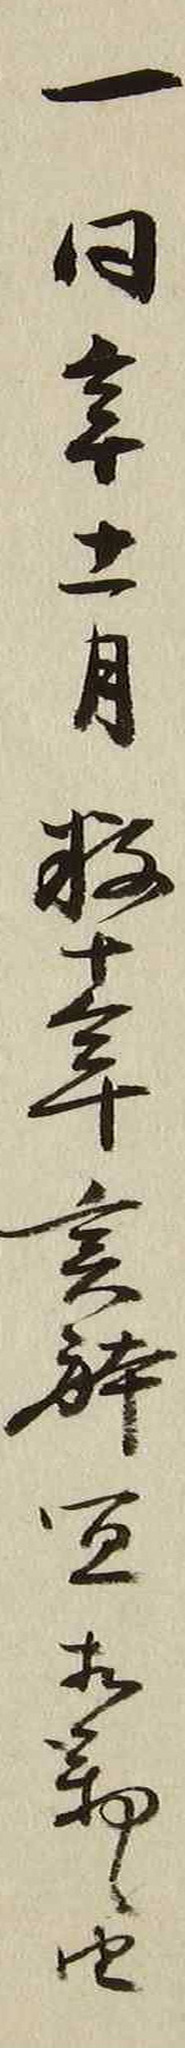一同年十一月数十年実体宜相勤候由
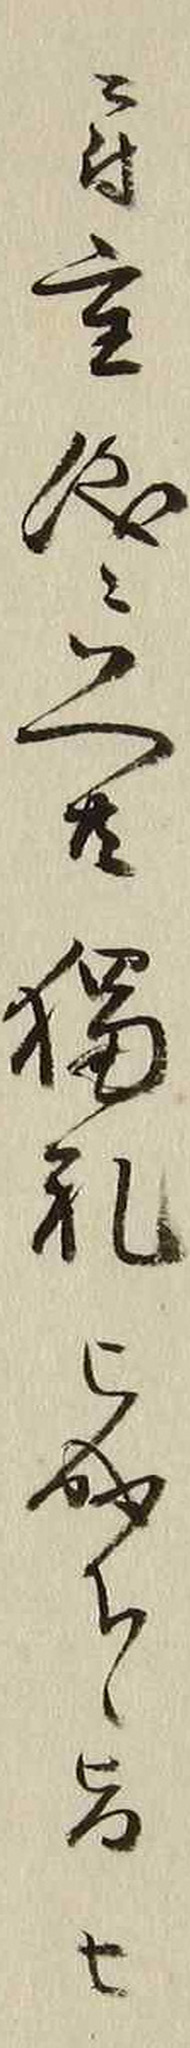ニ付重儀ニ候へ共独礼被成下之旨被
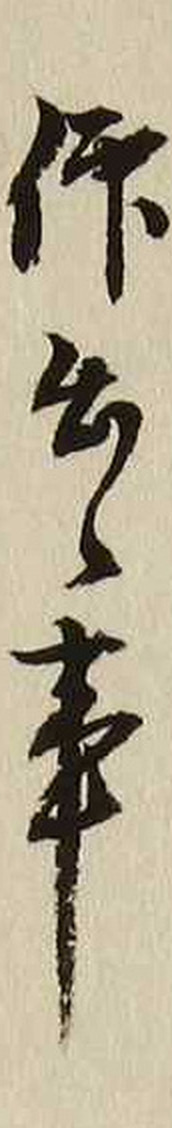仰出候事
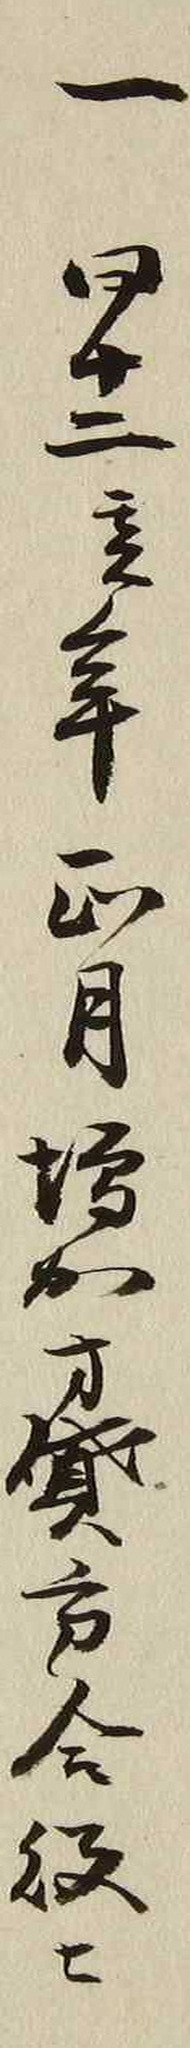一同十二亥年正月増加方貸方合役被
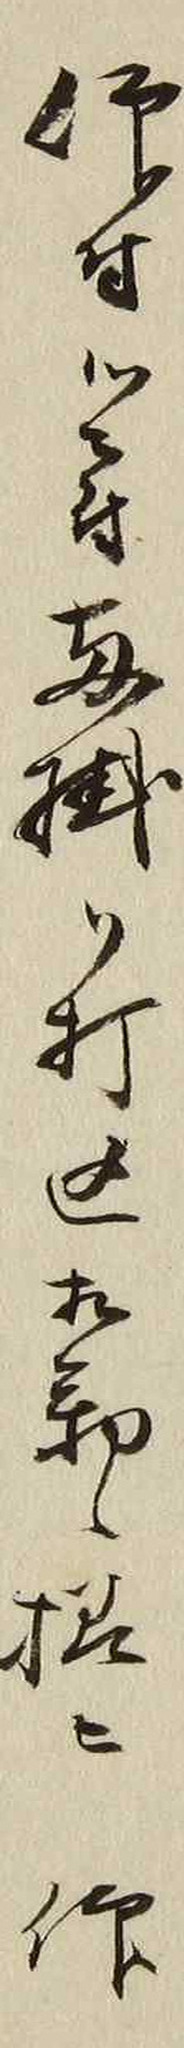仰付候ニ付両掛り打込相勤候様被仰
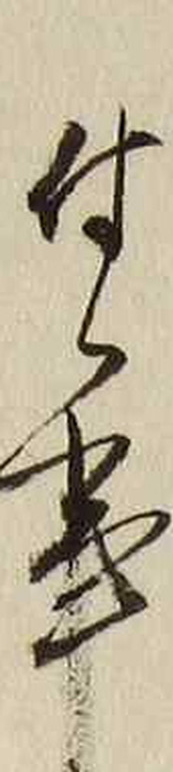付候事
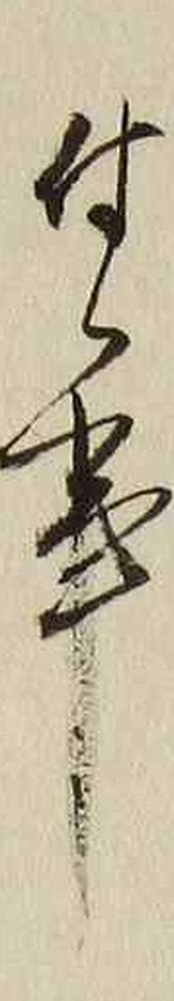付候事
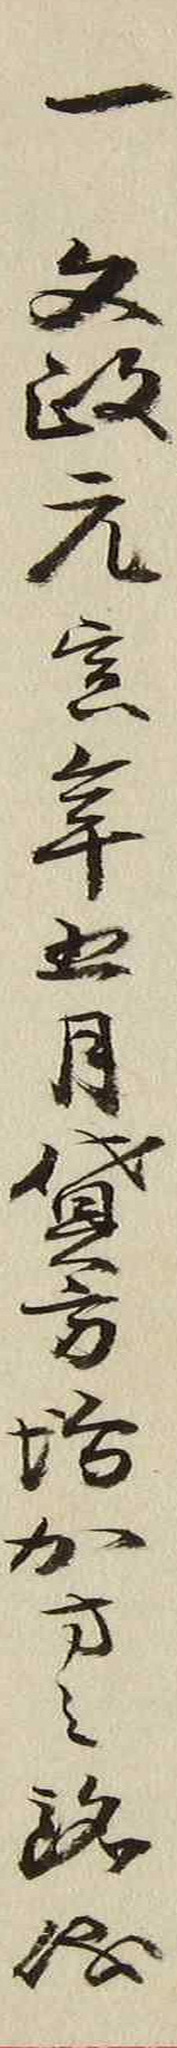一文政元寅年五月貸方増加方之銘儀
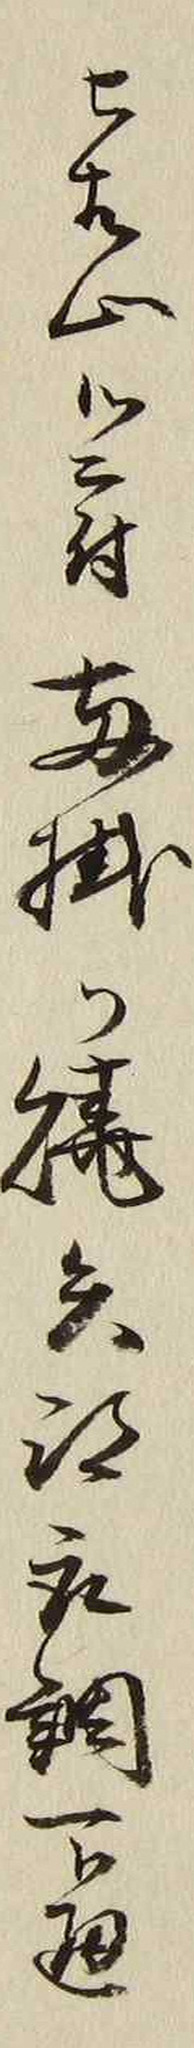被相止候ニ付両掛り焼失跡取調下通
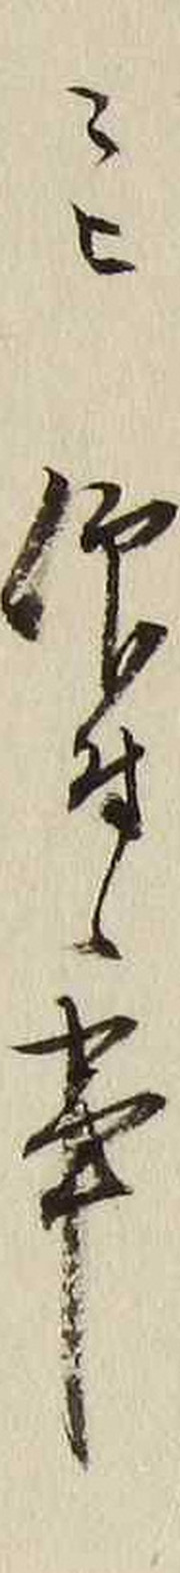々被仰付候事
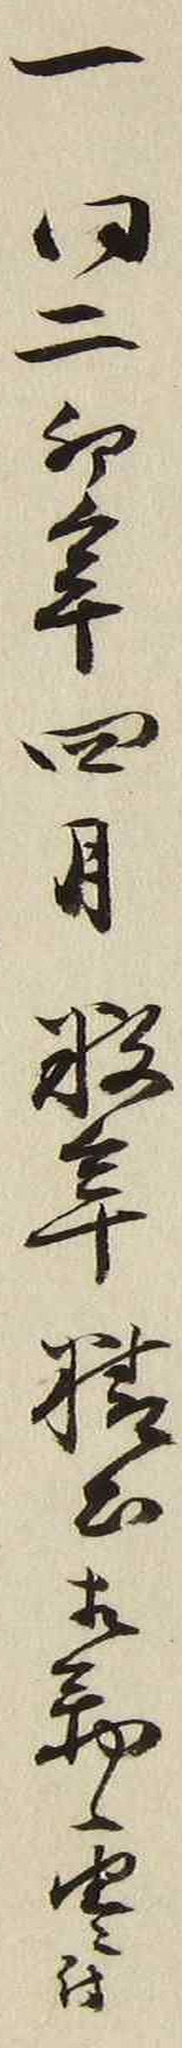一同二卯年四月数年精出相勤候由ニ付
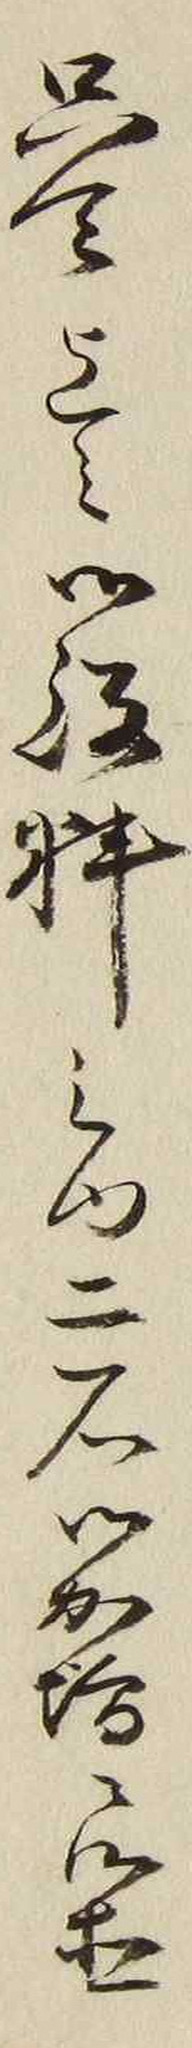只今迄之御役料之内二石御加増ニ御直
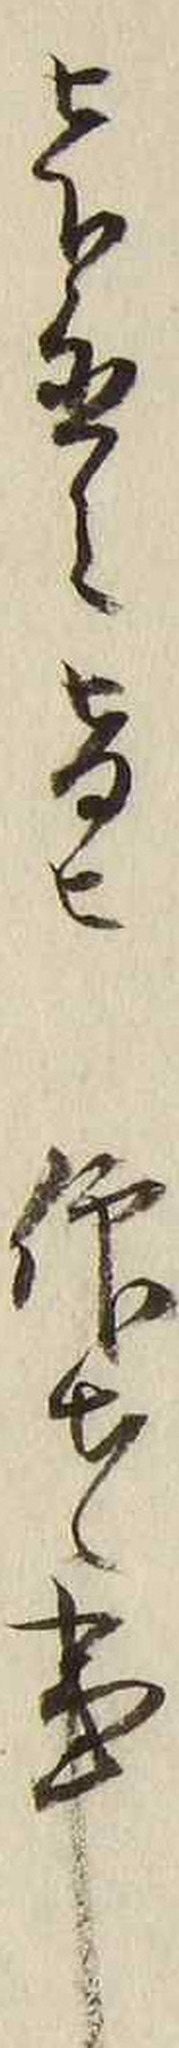被下置之旨被仰出候事
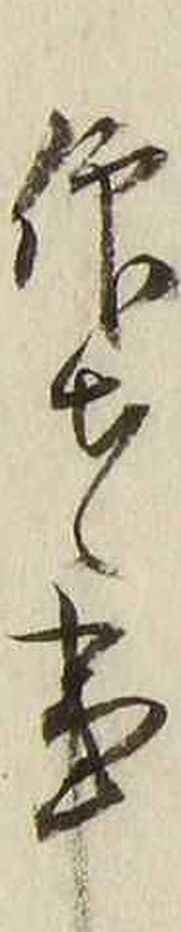仰出候事
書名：諸士系譜　巻之291　さ之部23
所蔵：会津若松市立会津図書館
